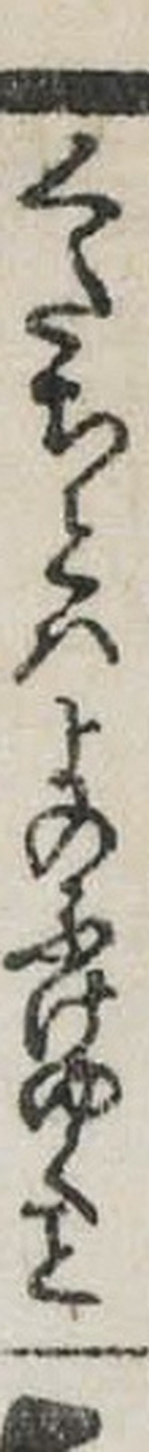くたちとはよのふけゆくこと
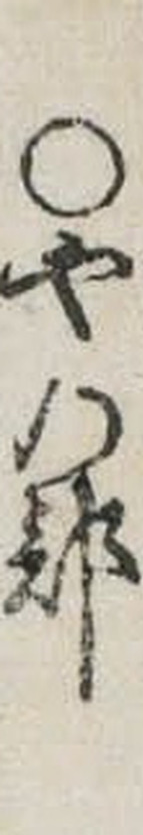○やの部
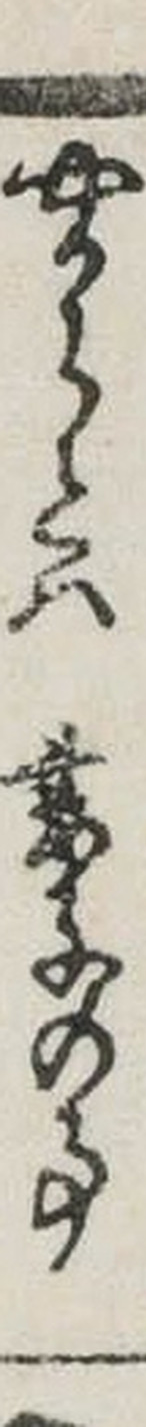やからとは妻子の事
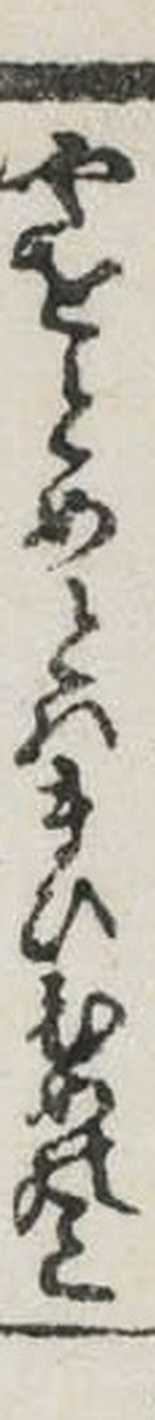やをとめとはまいひめのこと
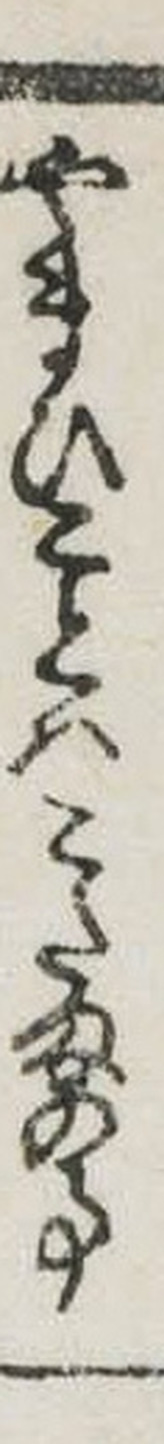やまひことはこたまの事
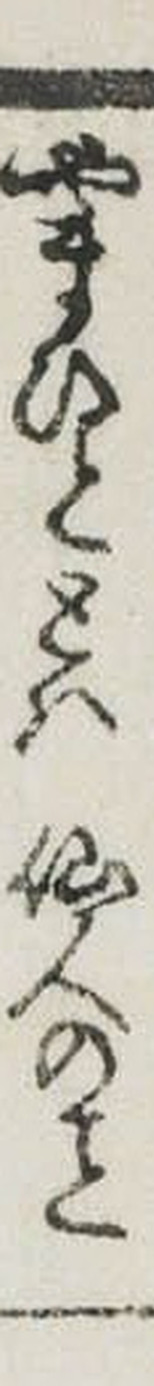やまひととは仙人のこと
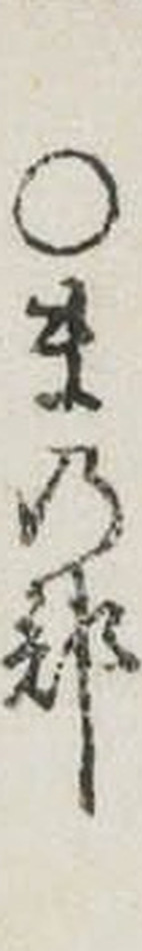○まの部
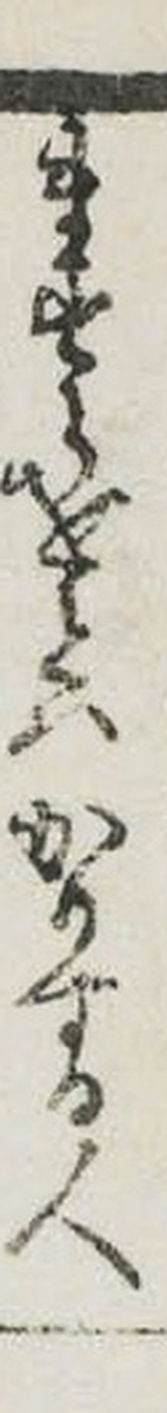ますらをとはかりする人
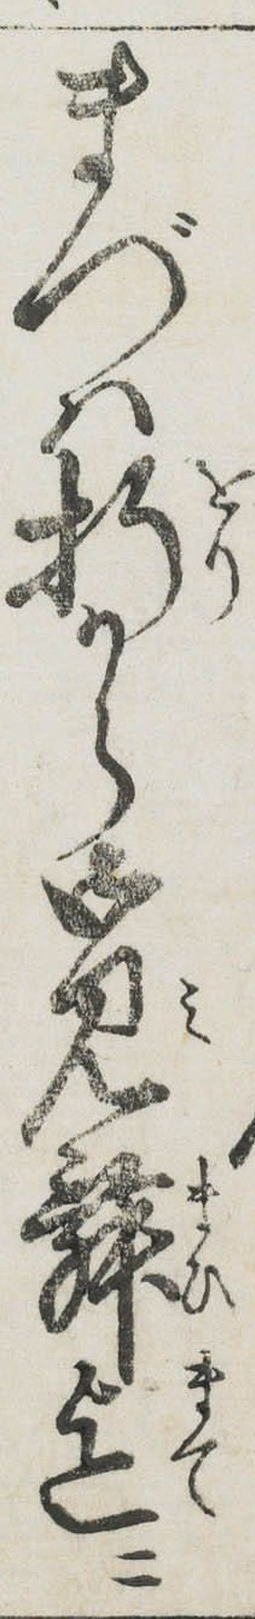まづは折から御見舞迄に
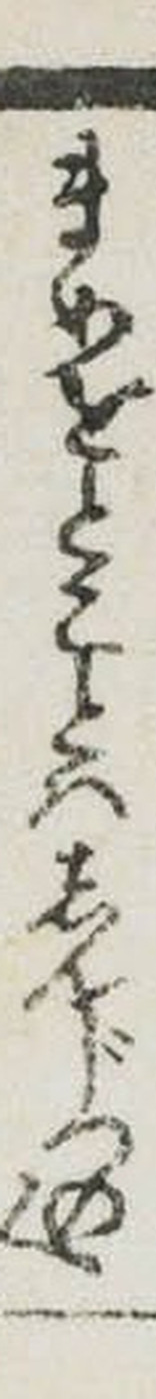まめをとことはしんじつの人
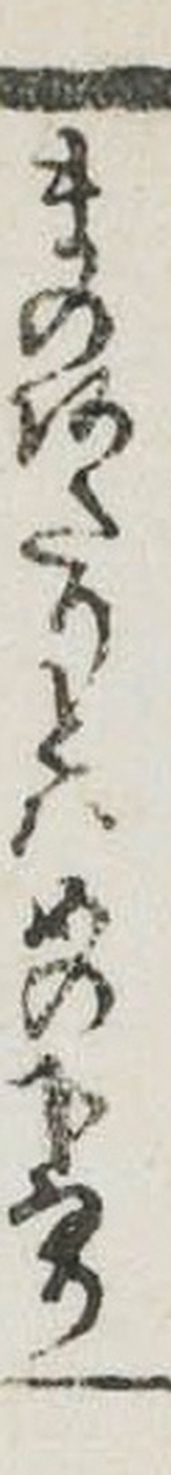まのあたりとはめの下なり
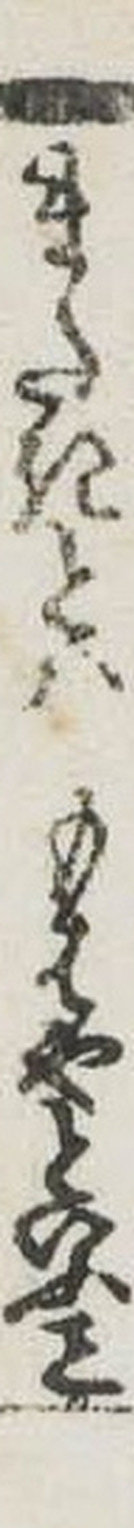またきとはもはやといふこと
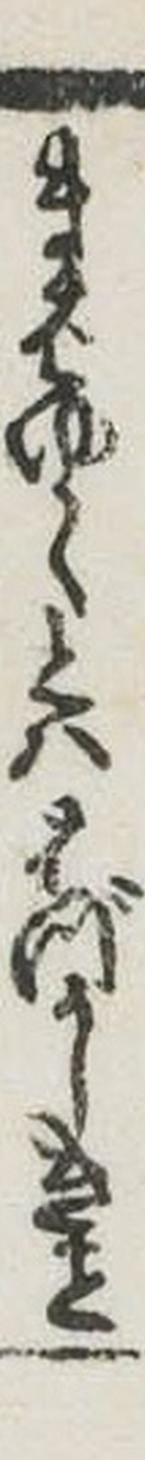まはゆくとははずかしきこと
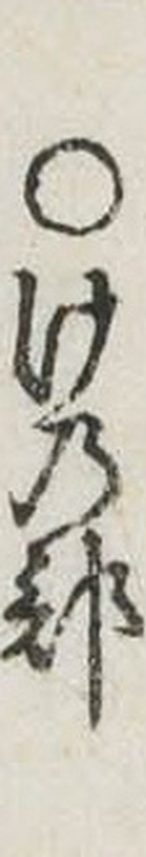○けの部
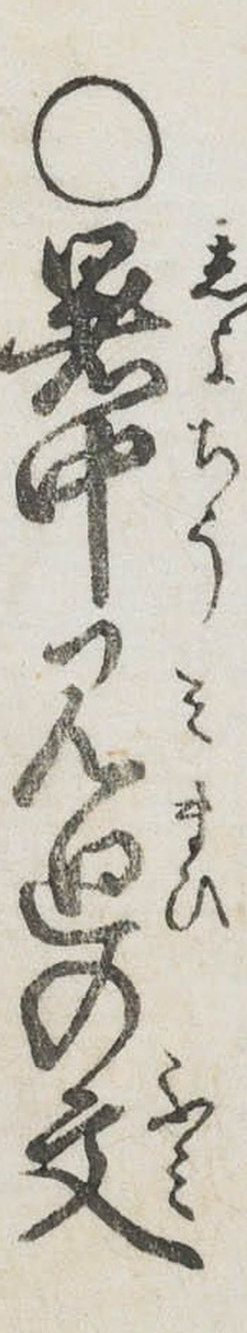○暑中見廻の文
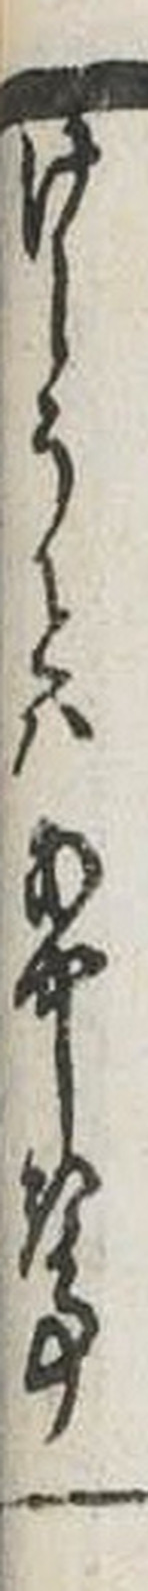けしうとはあやしき事
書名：頭書萬用婦人手紙之文言
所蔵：東京学芸大学教育コンテンツアーカイブ
